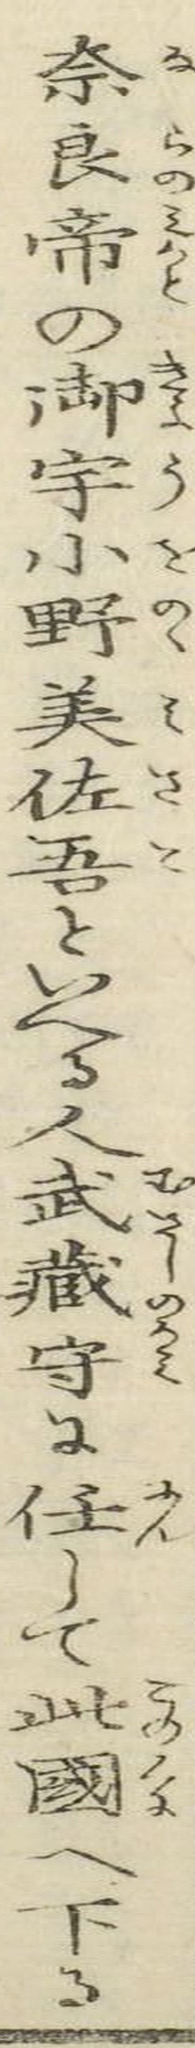奈良帝の御宇小野美佐吾といへる人武蔵守に任して此国へ下る
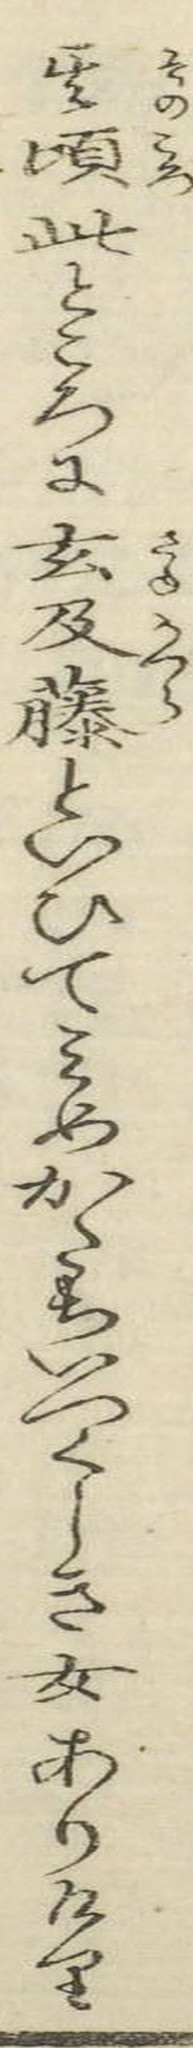其頃此ところに玄及藤といひてみめかたちいつくしき女ありけり
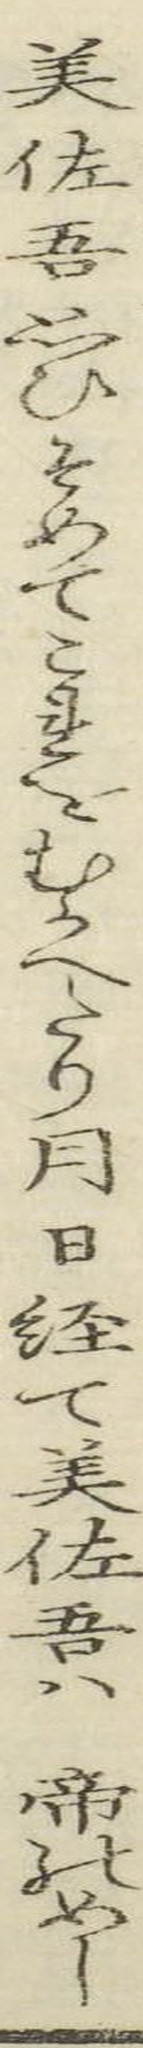美佐吾思そめてこれをむかへたり月日経て美佐吾は帝のめし
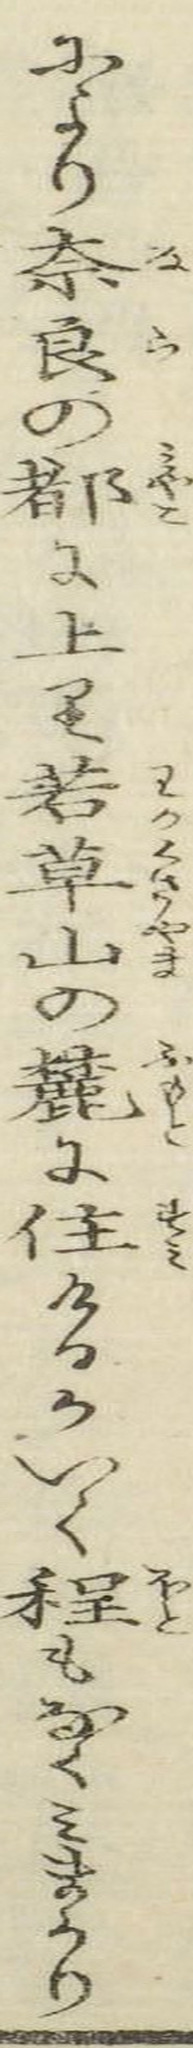により奈良の都に上り若草山の麓に住けるかいく程もなくみまかり
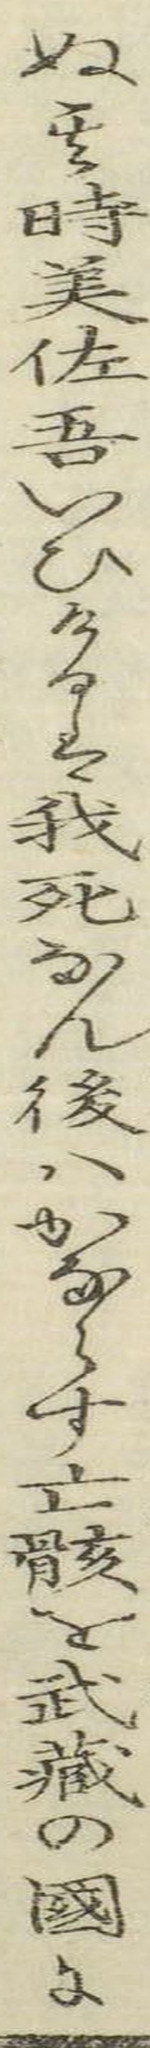ぬ其時美佐吾いひけるは我死なん後はかならす亡骸を武蔵の国に
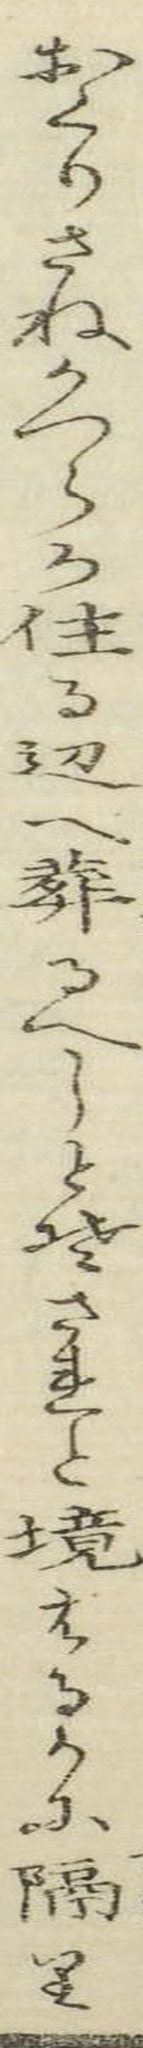おくりさねかつらか住る辺へ葬るへしとそされと境はるかに隔り
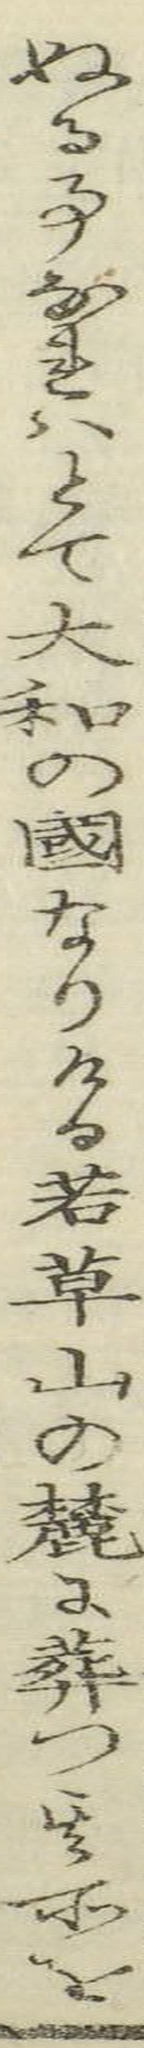ぬる事なれはとて大和の国なりける若草山の麓に葬つ其所を
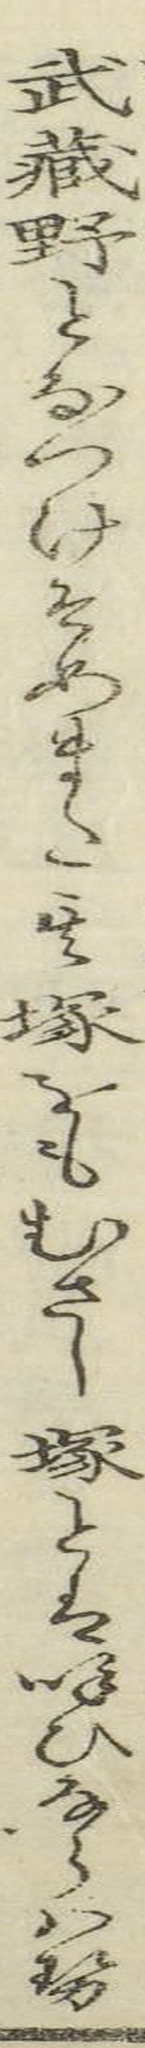武蔵野となつけそめまた其塚をもむさし塚とは呼ひならはせ
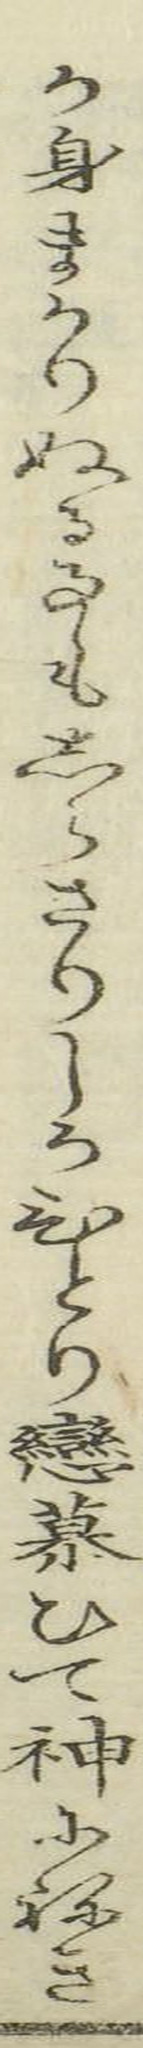か身まかりぬる事もしらさりしかひとり恋慕ひて神にねき
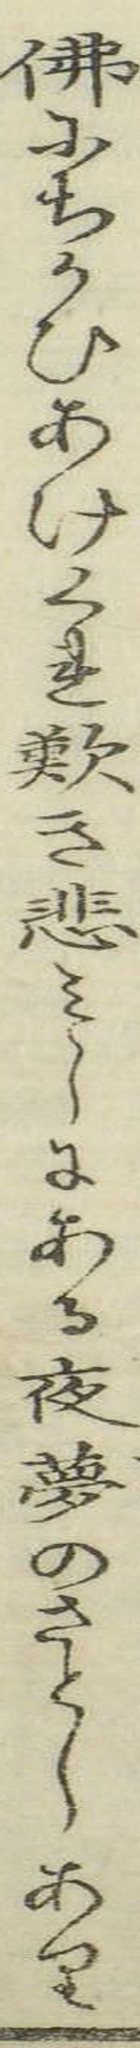仏にちかひあけくれ歎き悲みしにある夜夢のさとしあり
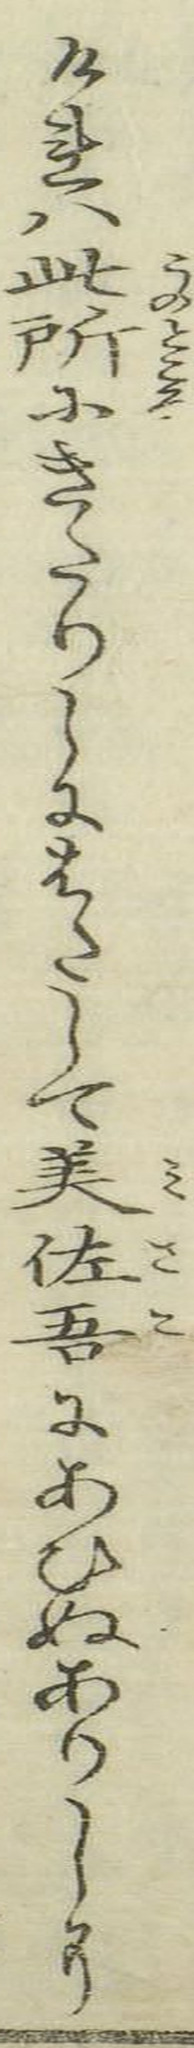けれは此所にきたりしにはたして美佐吾にあひぬありしに
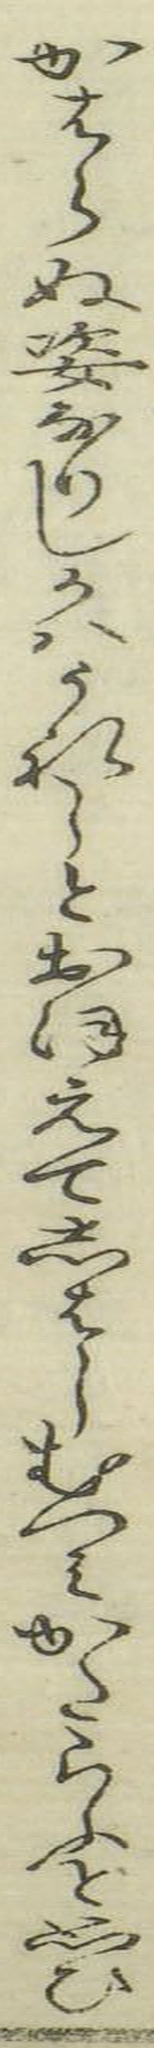かはらぬ姿なりしかはうれしとおほえてしはしむつみかたらふと思ひ

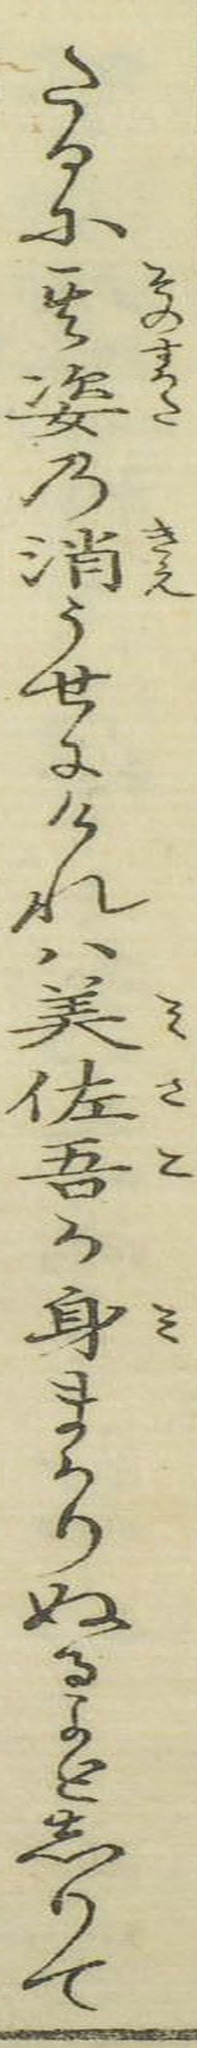たるに其姿の消うせにけれは美佐吾か身まかりぬるよとしりて
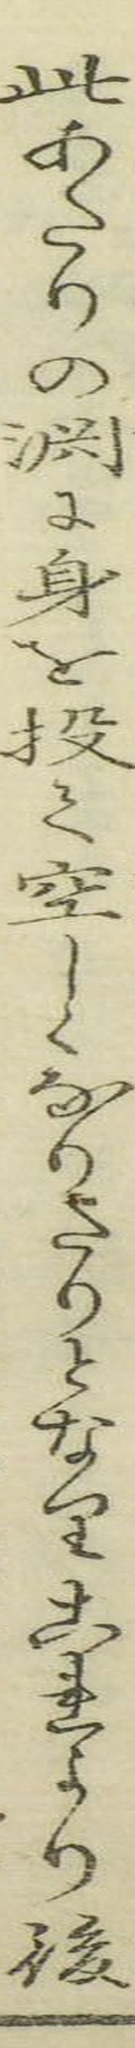此あたりの淵に身を投て空しくなりたりとなりこれより後
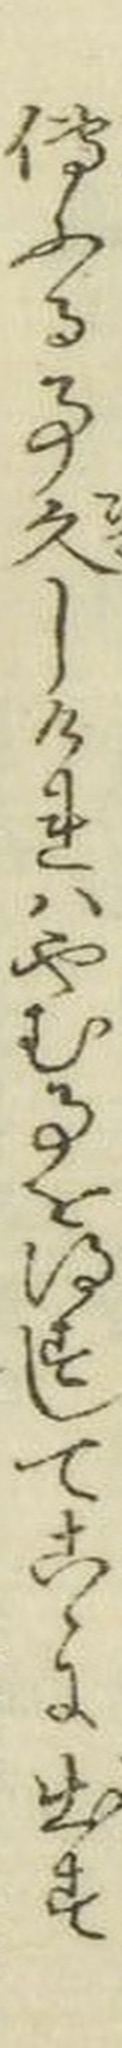伝ふる事久しけれはやむ事を得すしてこゝに出す
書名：江戸名所図会 20巻 巻之11
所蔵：東京学芸大学教育コンテンツアーカイブ
